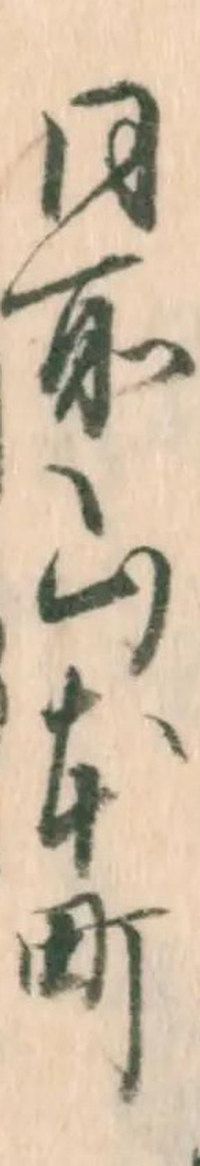同所山本町
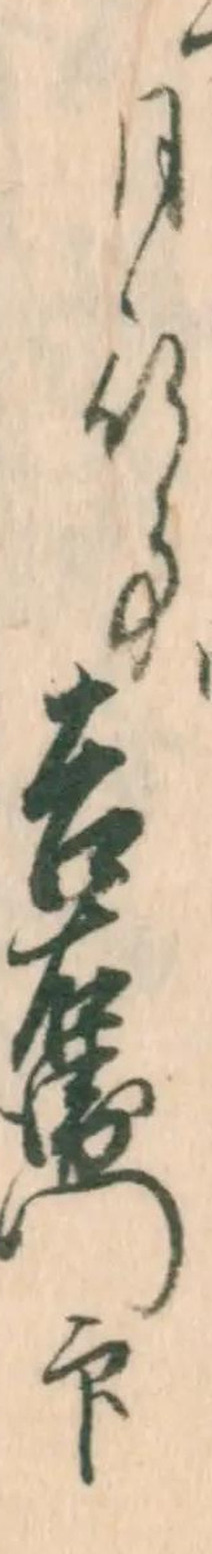月行事吉右衛門印
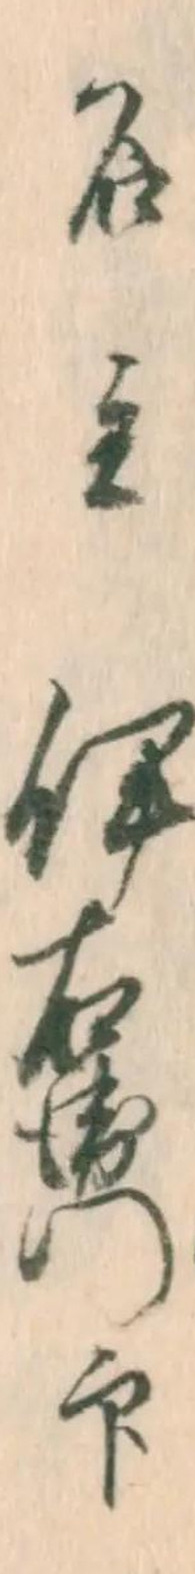名主伊右衛門印
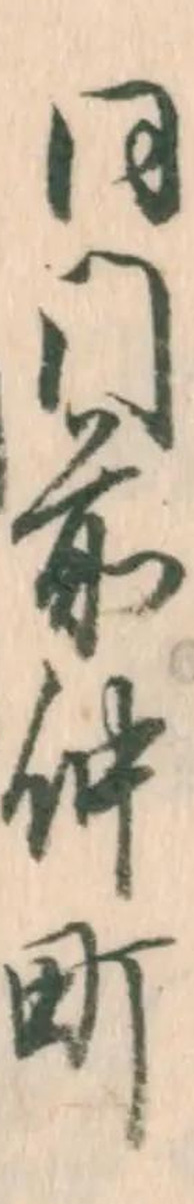同門前仲町
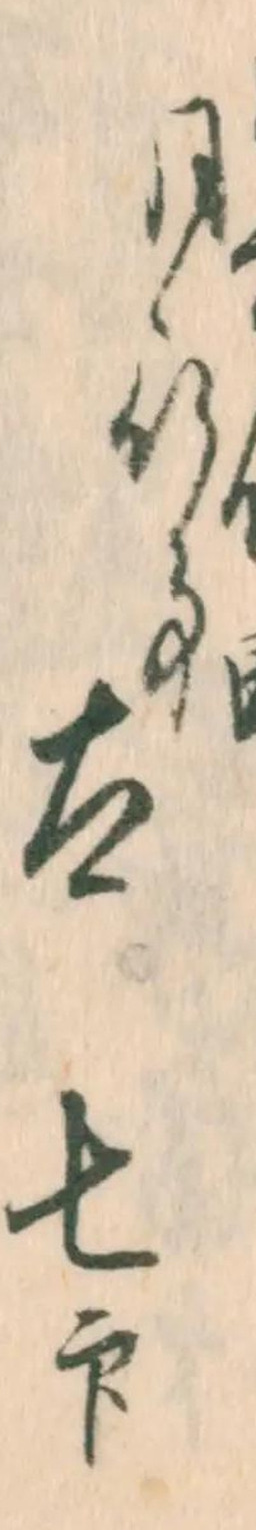月行事太七印
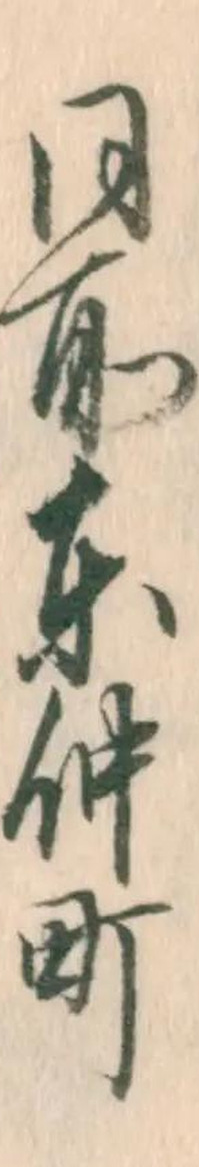同所東仲町
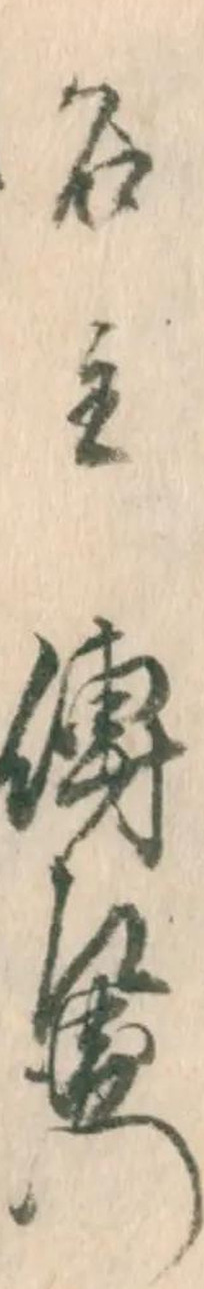名主伝左衛門

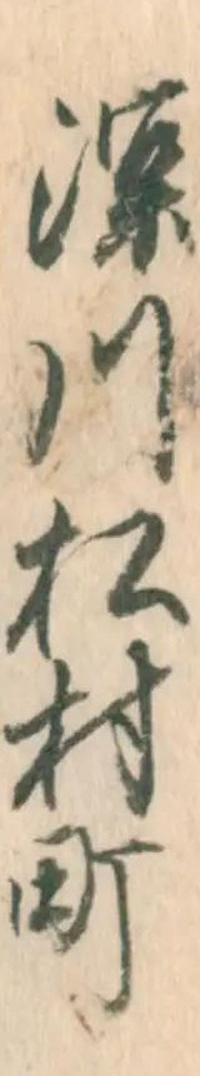深川松村町
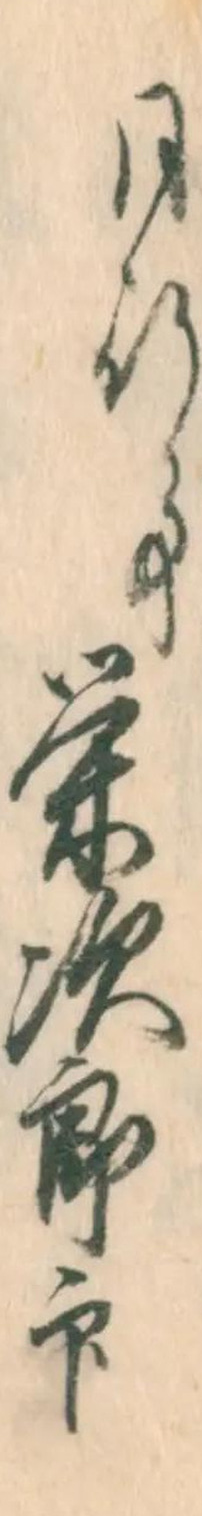月行事栄次郎印
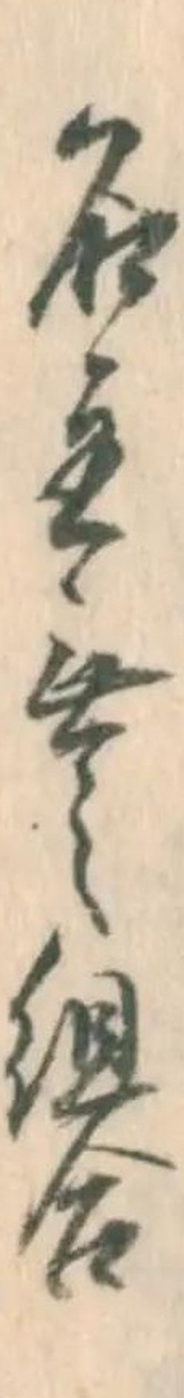名主無之組合
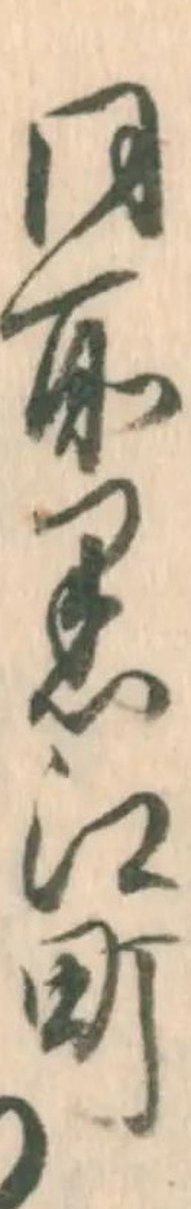同所黒江町
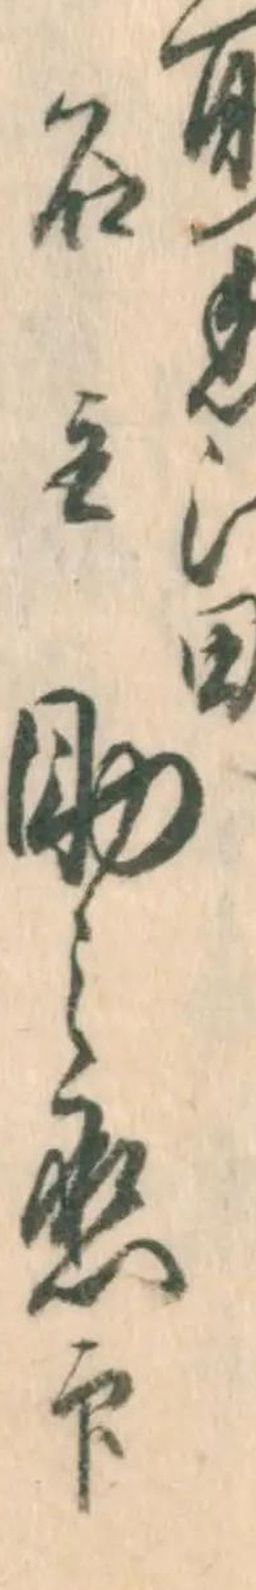名主助之丞印
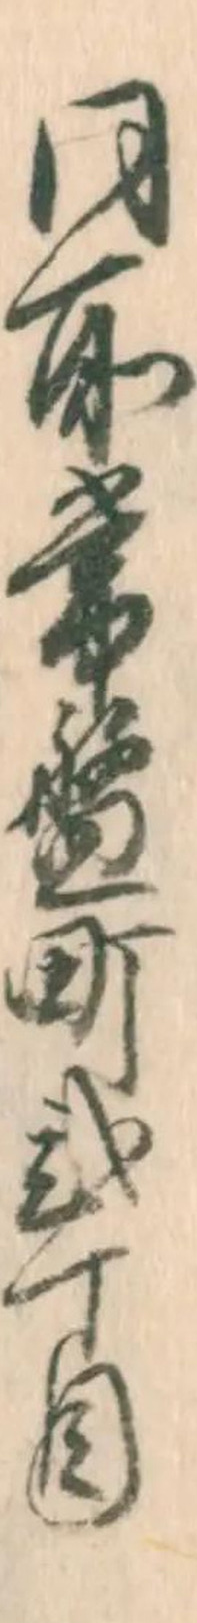同所常盤町弐丁目
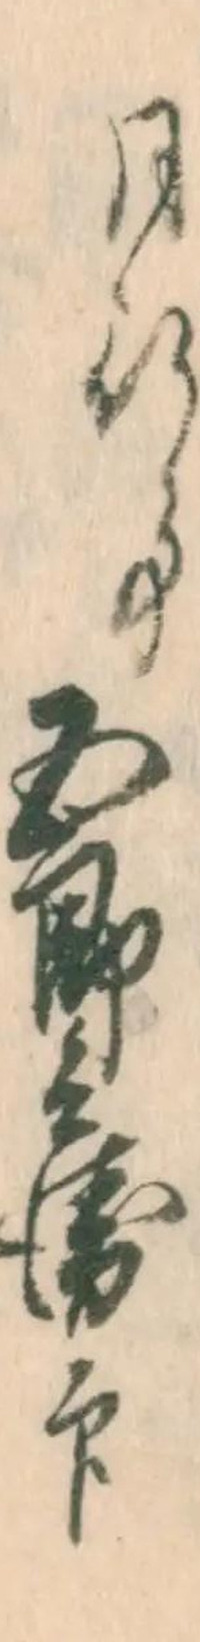月行事五郎兵衛印
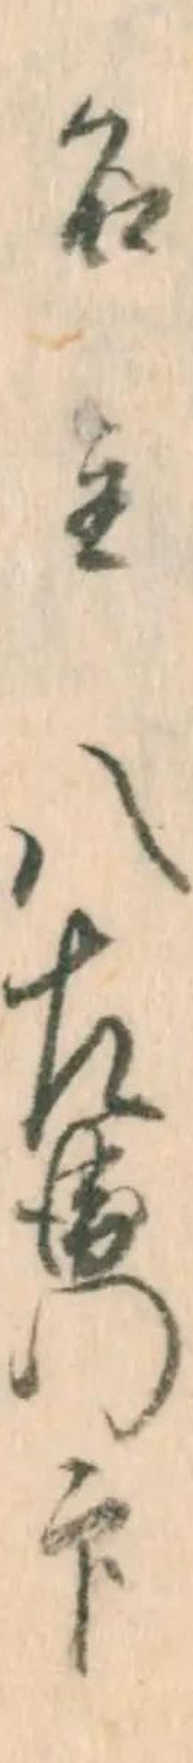名主八左衛門印
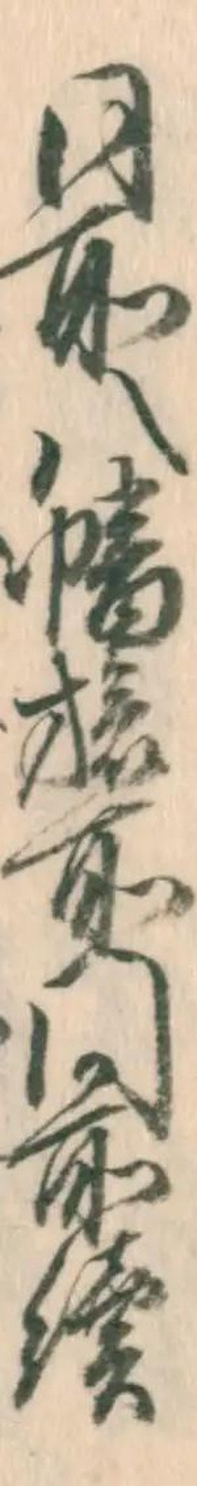同所八幡旅所同所続
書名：地震災書留 2巻. [2] 内表紙に「地震一件　安政二卯年十月」とあり
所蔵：国立国会図書館 National Diet Library, JAPAN
